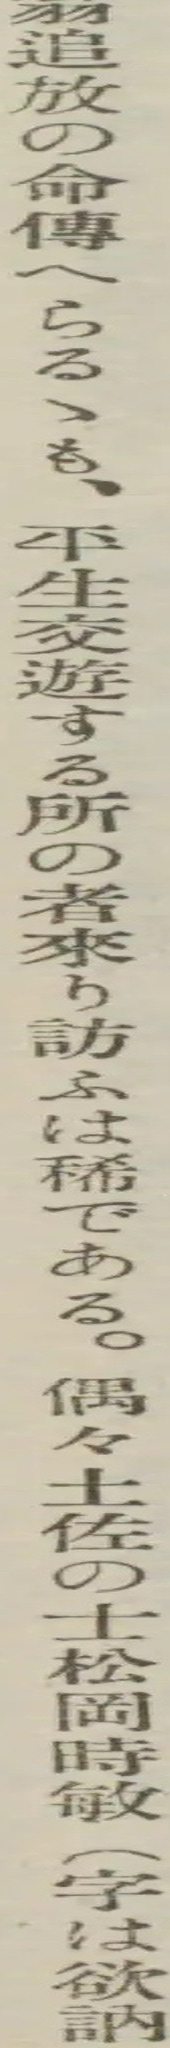翁追放の命伝へらるゝも、平生交遊する所の者来り訪ふは稀である。偶々土佐の士松岡時敏(字は欲訥
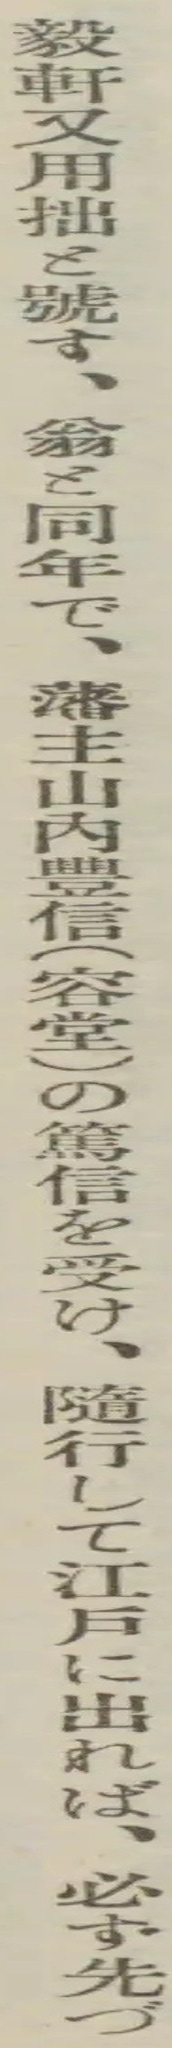毅軒又用拙と号す、翁と同年で、藩主山内豊信(容堂)の篤信を受け、随行して江戸に出れば、必ず先づ
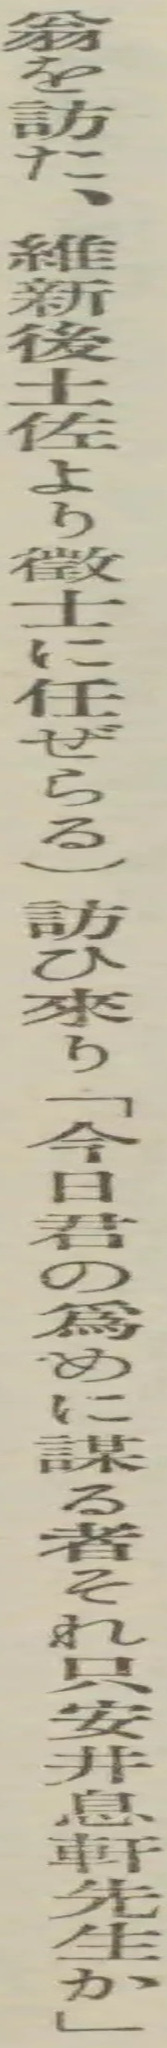翁を訪た、維新後土佐より徴士に任ぜらる)訪ひ来り「今日君の為めに謀る者それ只安井息軒先生か」
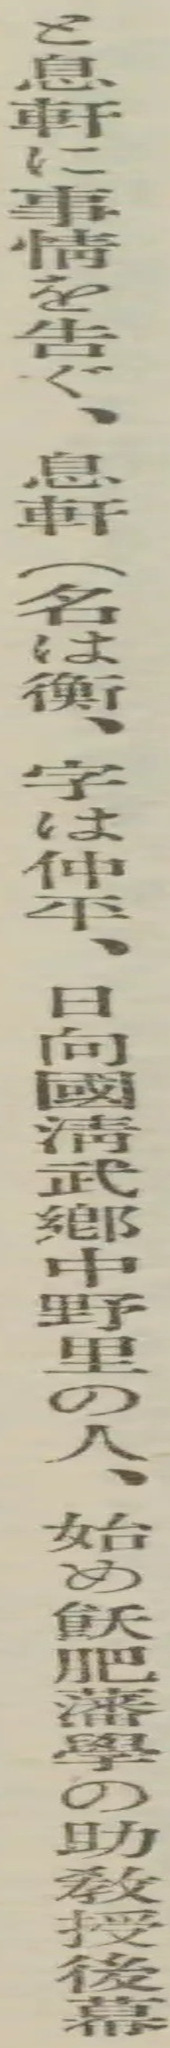と息軒に事情を告ぐ、息軒(名は衡、字は仲平、日向国清武郷中野里の人、始め飫肥藩学の助教授後幕
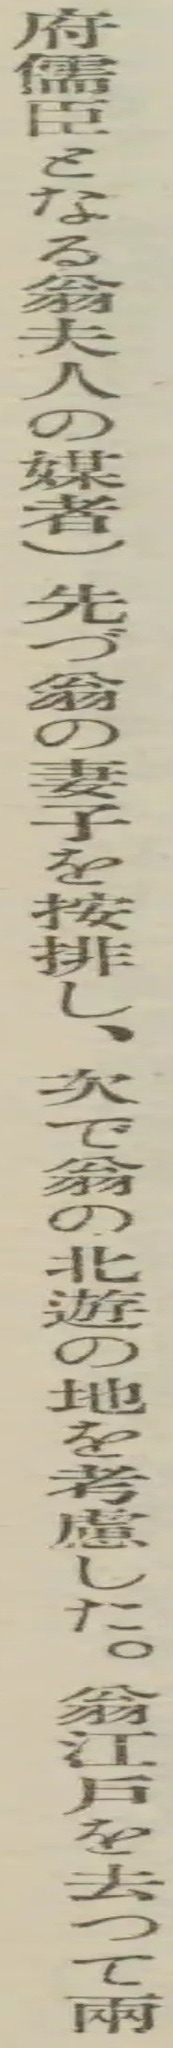府儒臣となる翁夫人の媒者)先づ翁の妻子を按排し、次で翁の北遊の地を考慮した。翁江戸を去つて両
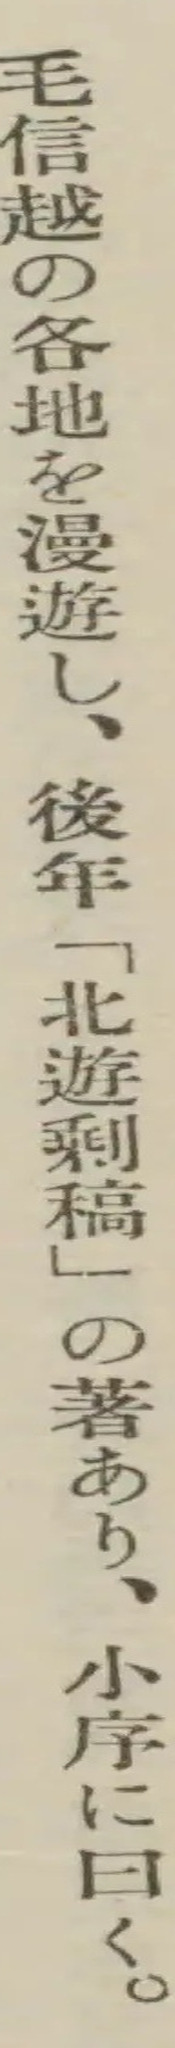毛信越の各地を漫遊し、後年「北遊剰稿」の著あり、小序に曰く。
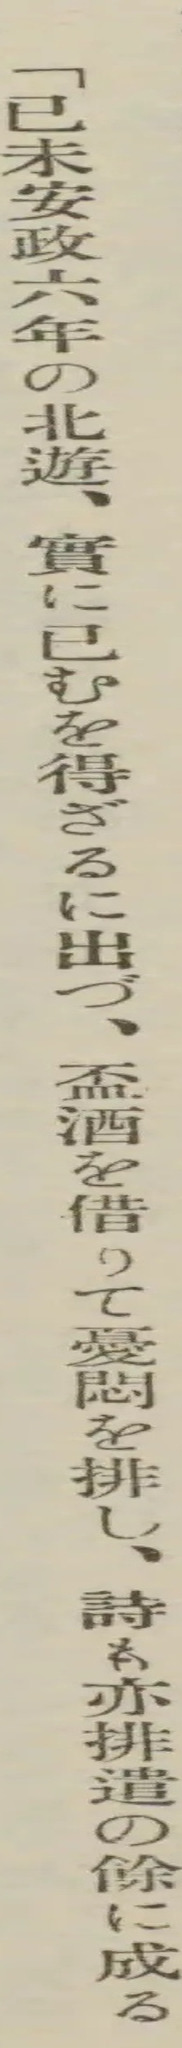「己未安政六年の北遊、実に已むを得ざるに出づ、盃酒を借りて憂悶を排し、詩も亦排遣の余に成る
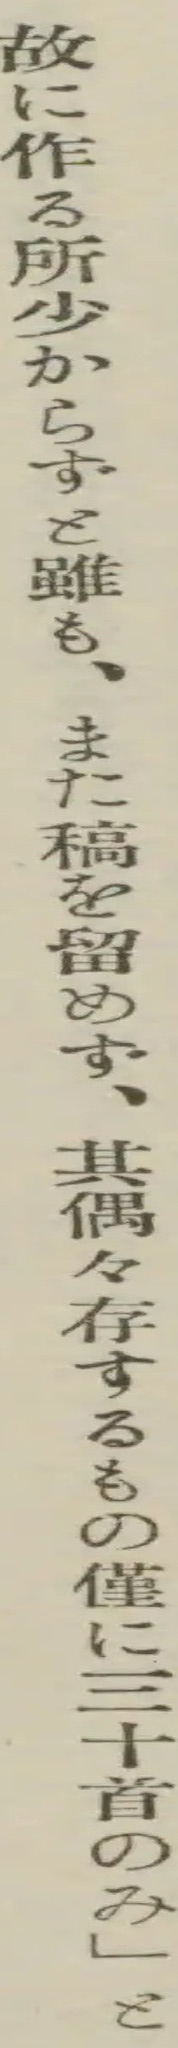故に作る所少からずと雖も、また稿を留めす、其偶々存するもの僅に三十首のみ」と
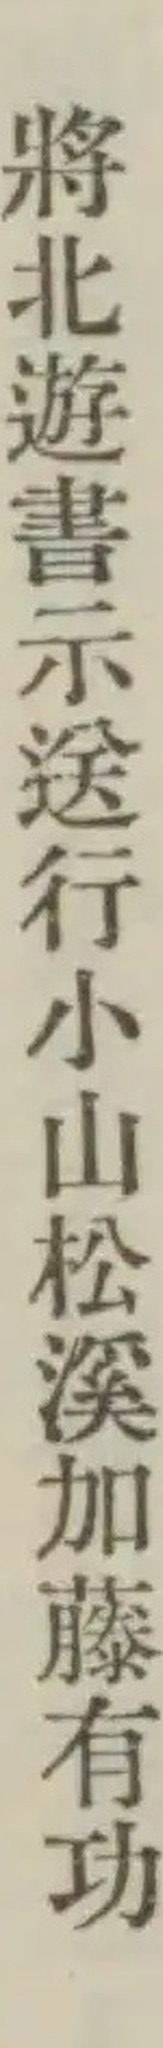將北遊書示送行小山松渓加藤有功
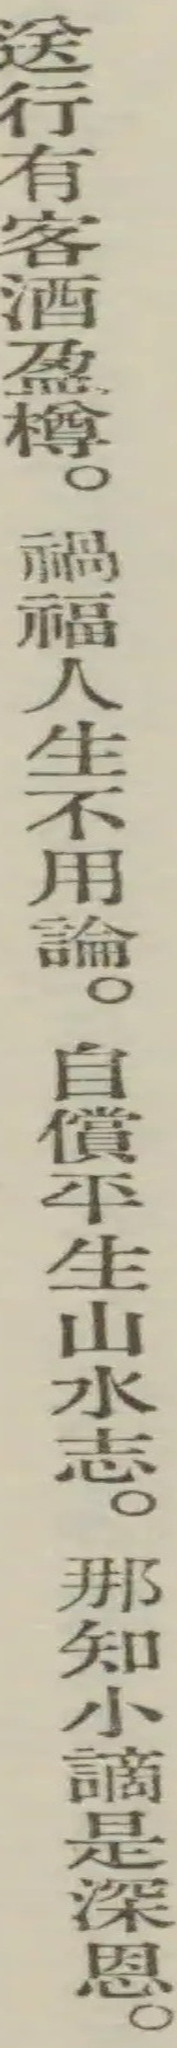送行有客酒盈樽。禍福人生不用論。自償平生水志。那知小謫是深恩。
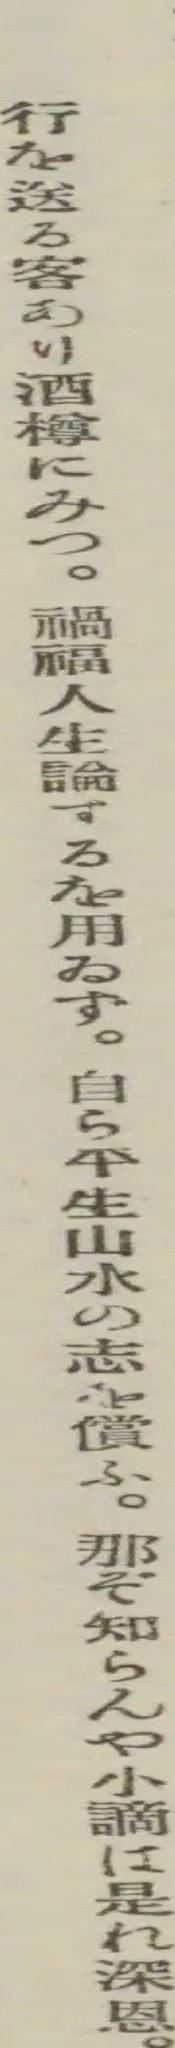行を送る客あり酒樽にみつ。禍福人生論するを用ゐず。自ら平生山水の志を償ふ。那ぞ知らんや小謫は是れ深恩。
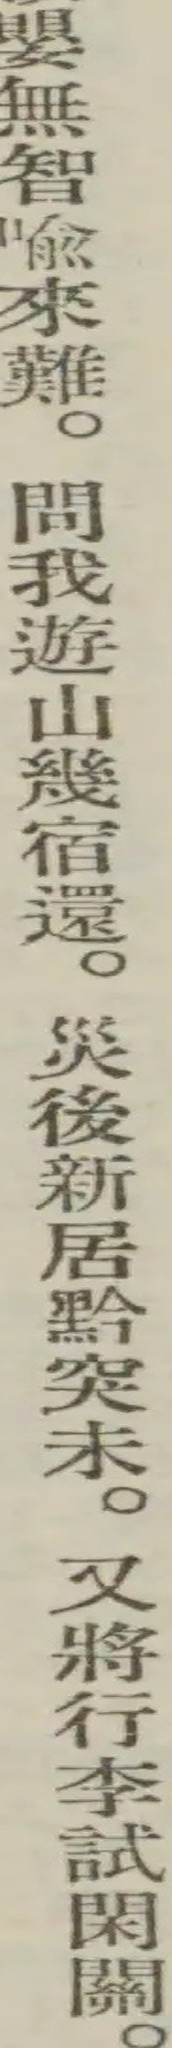孩嬰無智喩来難。問我遊山幾宿還。災後新居黔突未。又將行李試閑關。
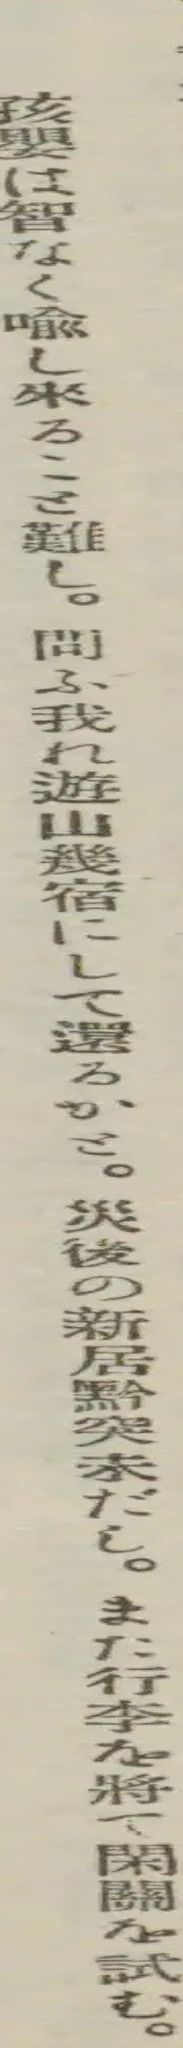孩嬰は智なく喩し来ること難し。問ふ我れ遊山幾宿にして還るかと。災後の新居黔突未だし。また行李を将て閑関を試る。
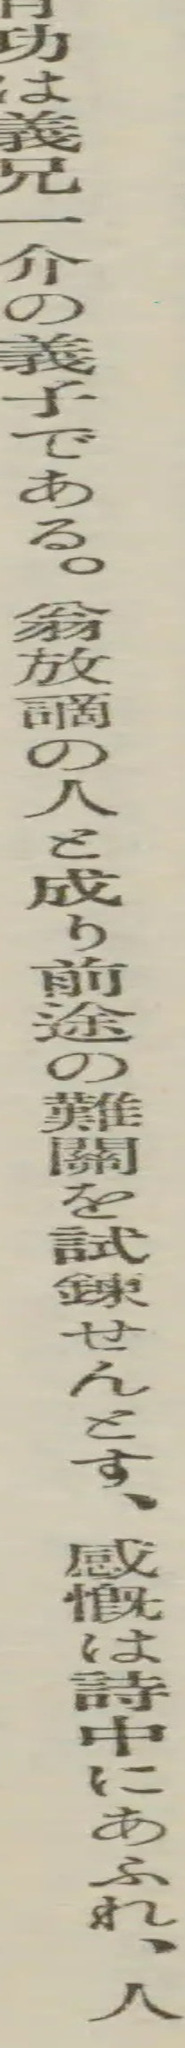有功は義兄一介の義子である。翁放謫の人と成り前途の難関を試練せんとす、感慨は詩中にあふれ、人
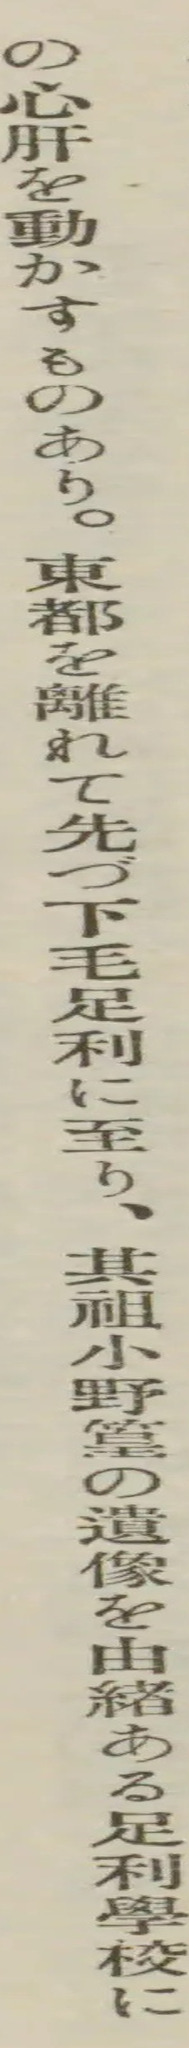の心肝を動かすものあり。東都を離れて先づ下毛足利に至り、其祖小野篁の遺像を由緒ある足利学校に
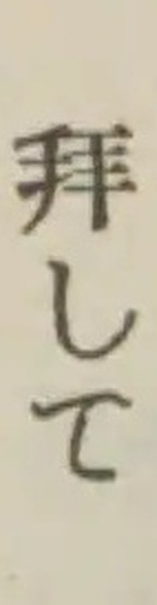拝して
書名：小野湖山翁小伝
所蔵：国立国会図書館 National Diet Library, JAPAN
